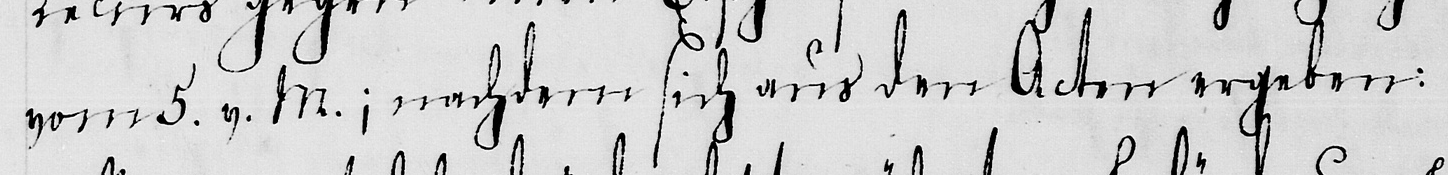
vom 5. v. M.; nachdem sich aus den Acten ergeben:
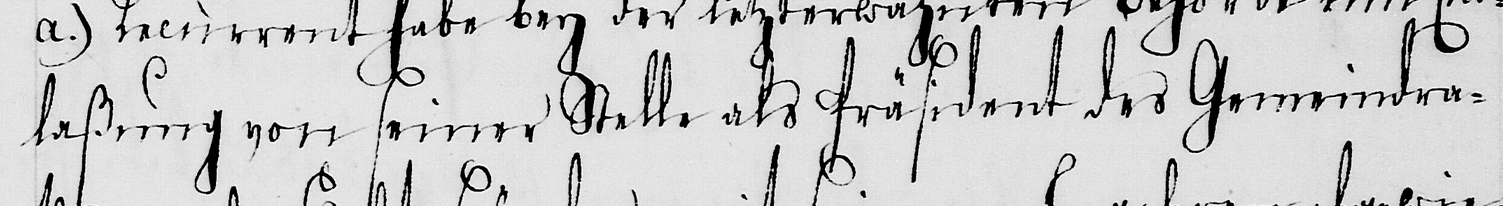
laßung von seiner Stelle als Präsident des Gemeindra¬
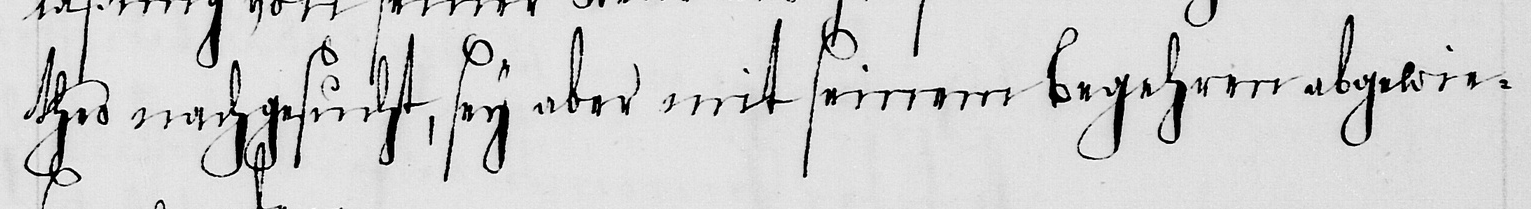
thes nachgesucht, sey aber mit seinem Begehren abgewie¬
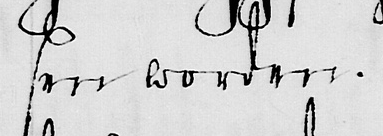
sen worden.
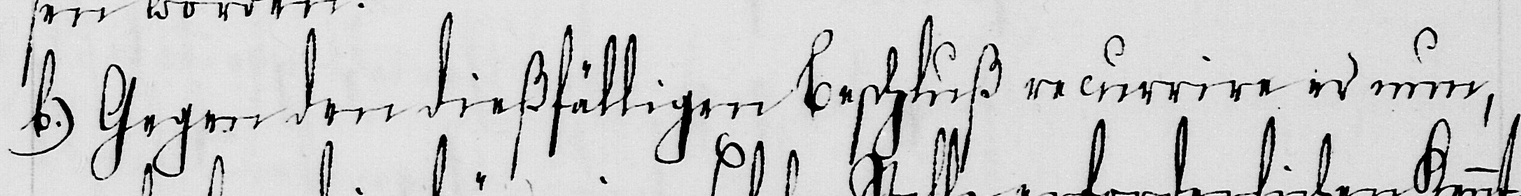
b.) Gegen den dießfälligen Beschluß recurrire er nun,
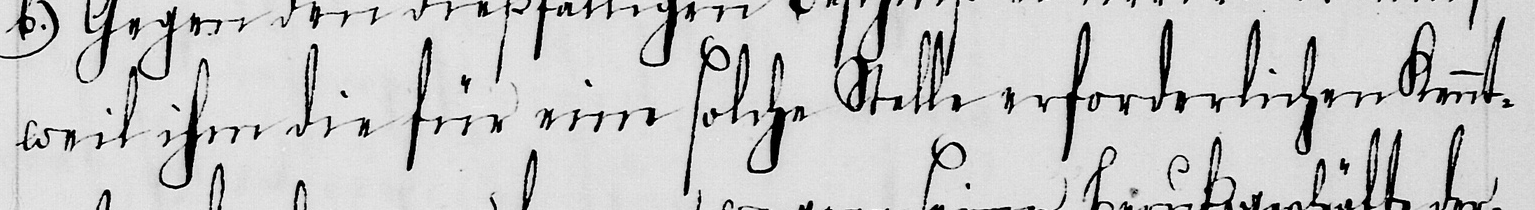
weil ihm die für eine solche Stelle erforderlichen Kenn¬
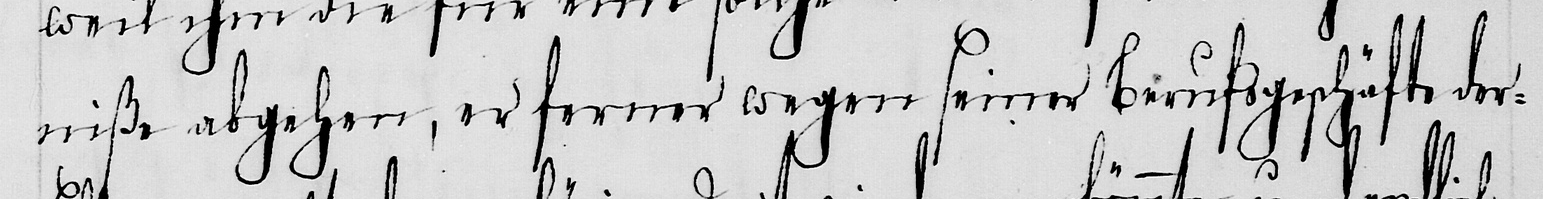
tniße abgehen, er ferner wegen seiner Berufsgeschäfte der¬
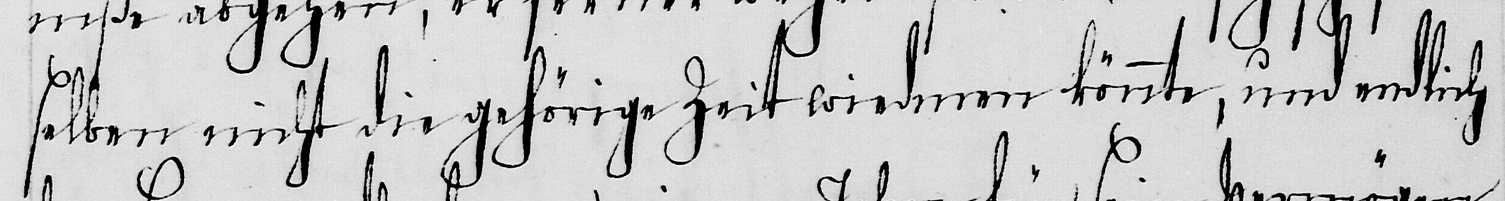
selben nicht die gehörige Zeit wiedmen könnte, und endlich
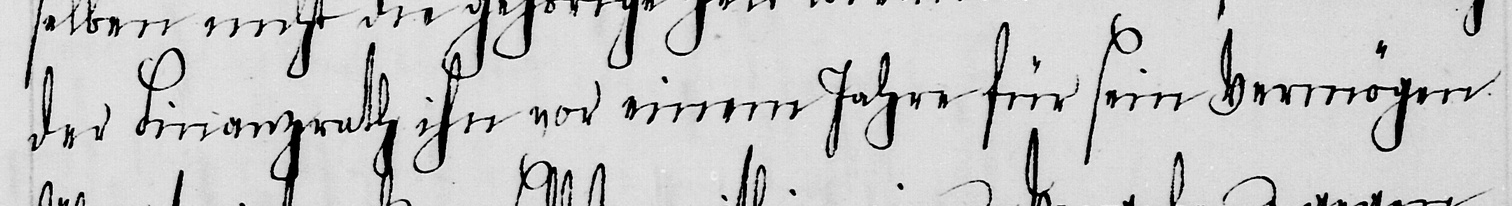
der Finanzrath ihn vor einem Jahre für sein Vermögen
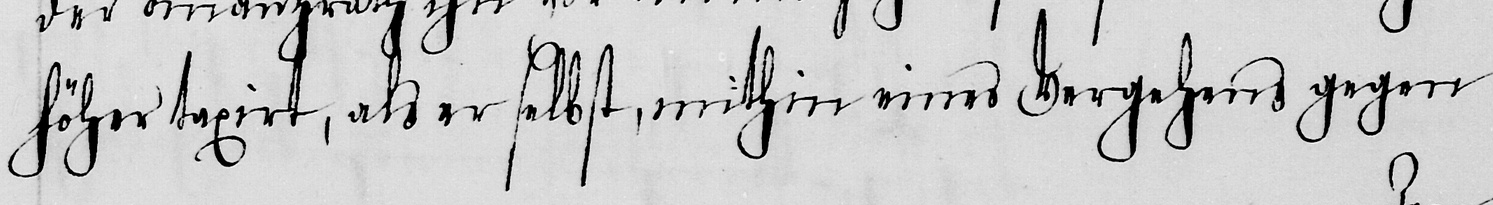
höher taxirt, als er selbst, mithin eines Vergehens gegen
